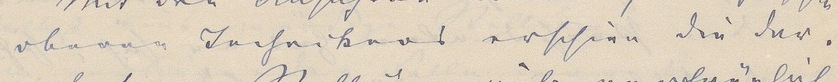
oberen Technikers erschien die dar-
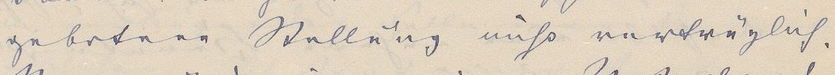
gebotene Stellung nicht verträglich.
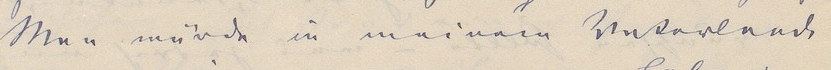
Man würde in meinem Vaterland
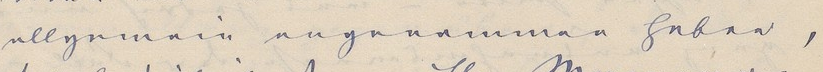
allgemein angenommen haben,
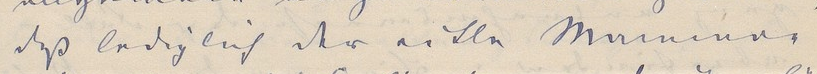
daß lediglich der eitle Mammon
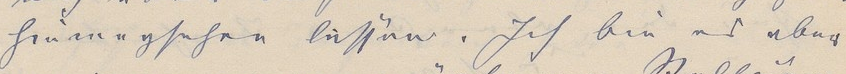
hinwegsehen lassen. Ich bin es aber
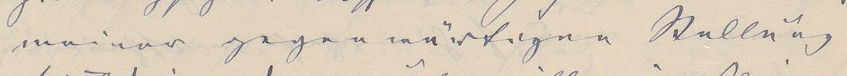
meiner gegenwärtigen Stellung
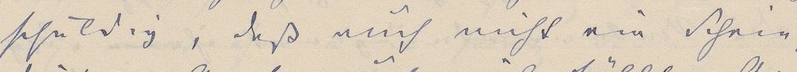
schuldig, daß auch nicht ein Schein
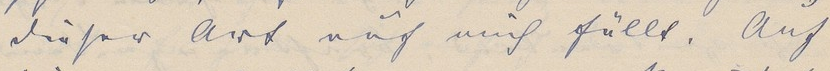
dieser Art auf mich fällt. Auf
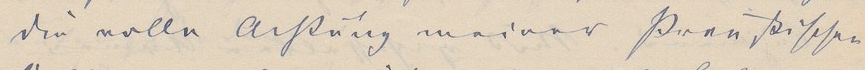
die volle Achtung meiner Preußischen
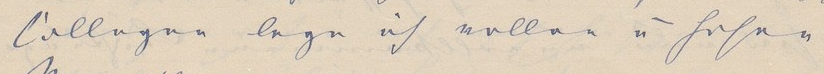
Collegen lege ich vollen u hohen
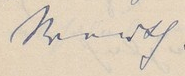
Werth.
